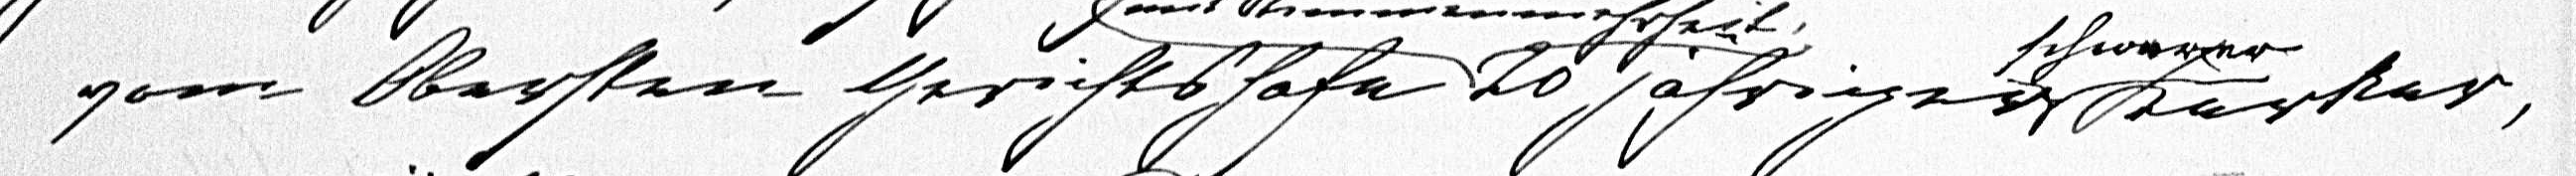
vom Obersten Gerichtshofe 20 jähriger Kerker,
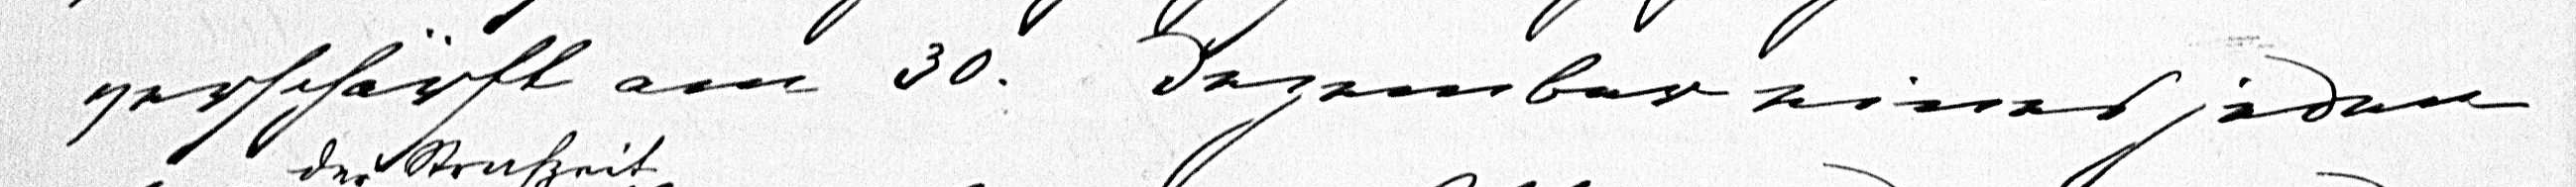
verschärft am 30. Dezember eines jeden
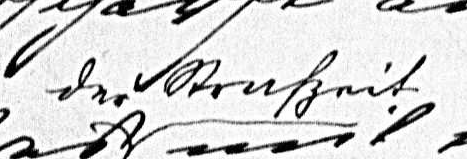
der Strafzeit
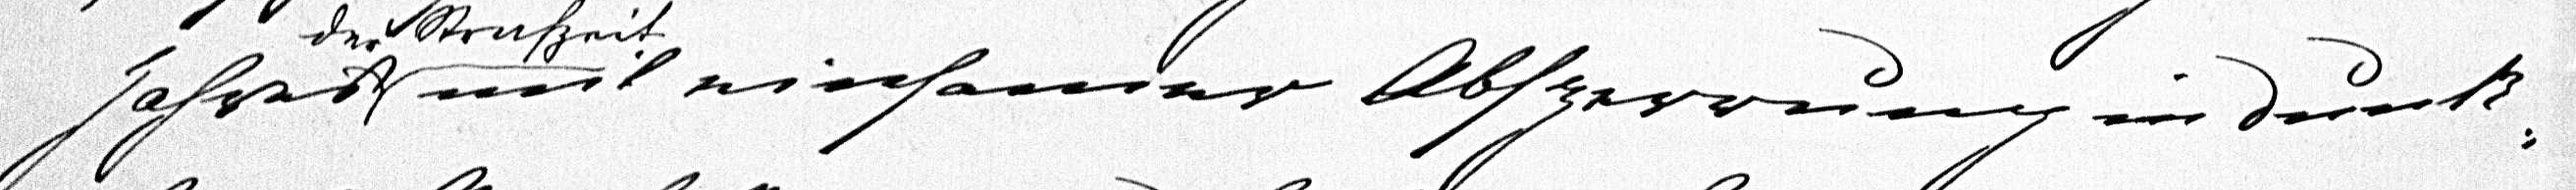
Jahres mit einsamer Absperrung in dunk¬
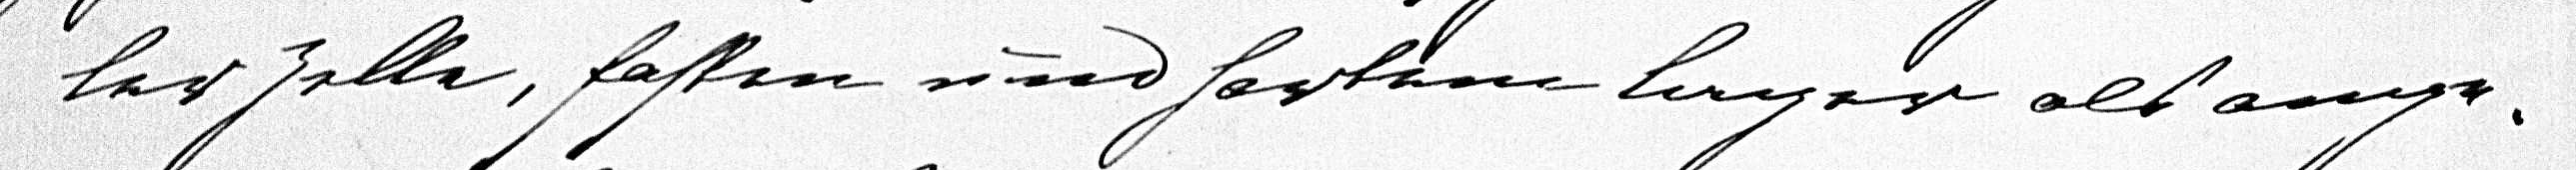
ler Zelle, fasten und hartem lager als ange¬
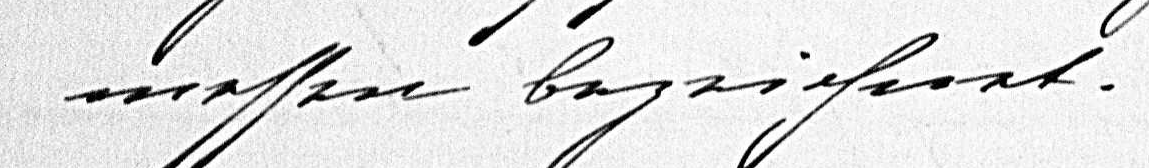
messen bezeichnet.
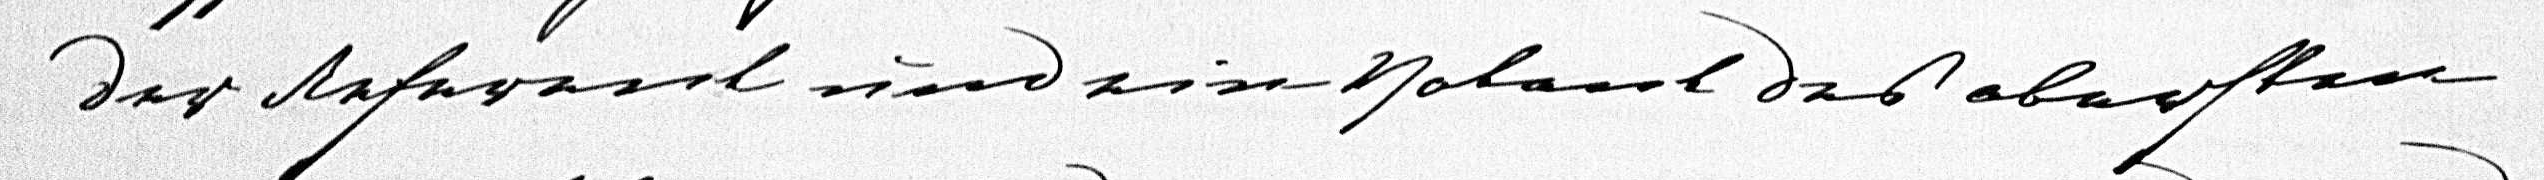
Der Referent und ein Volant des obersten
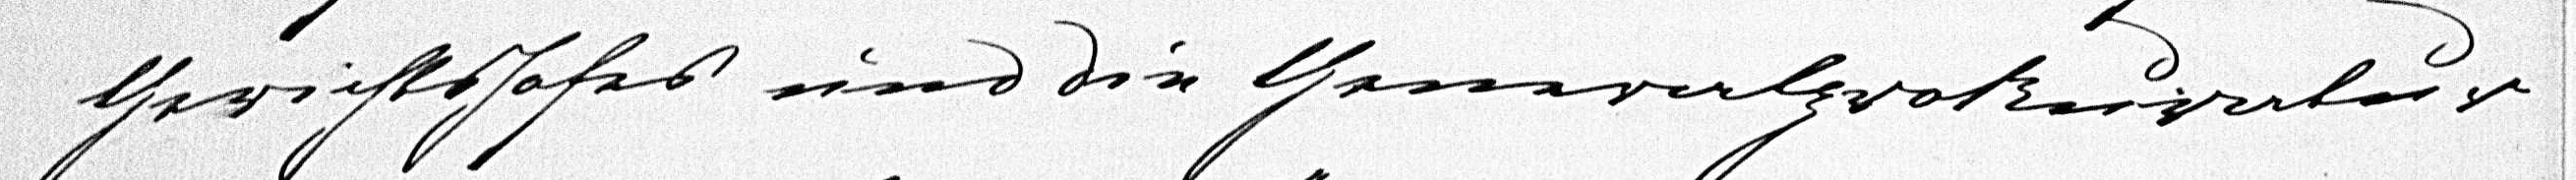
Gerichtshofes und die Generalprokuratur
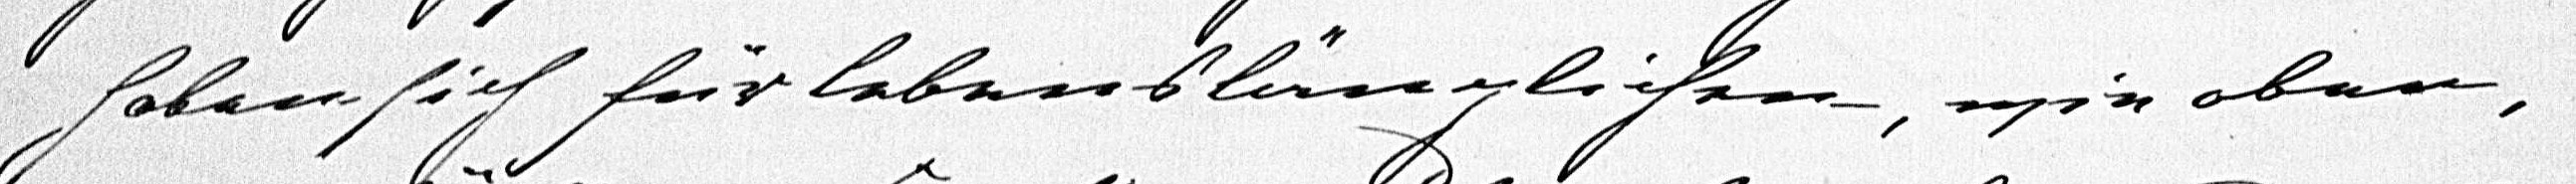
haben sich für lebenslänglichen, wie oben,
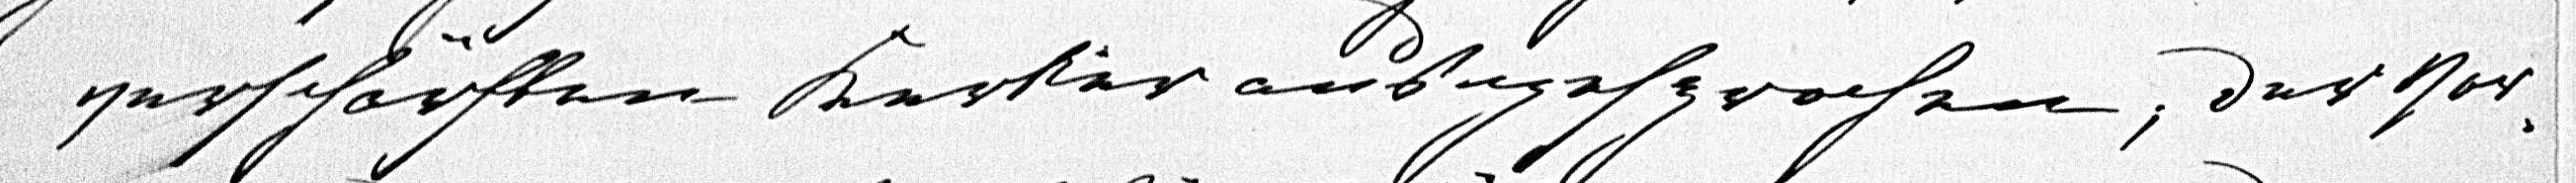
verschärften Kerker ausgesprochen; der Vor¬
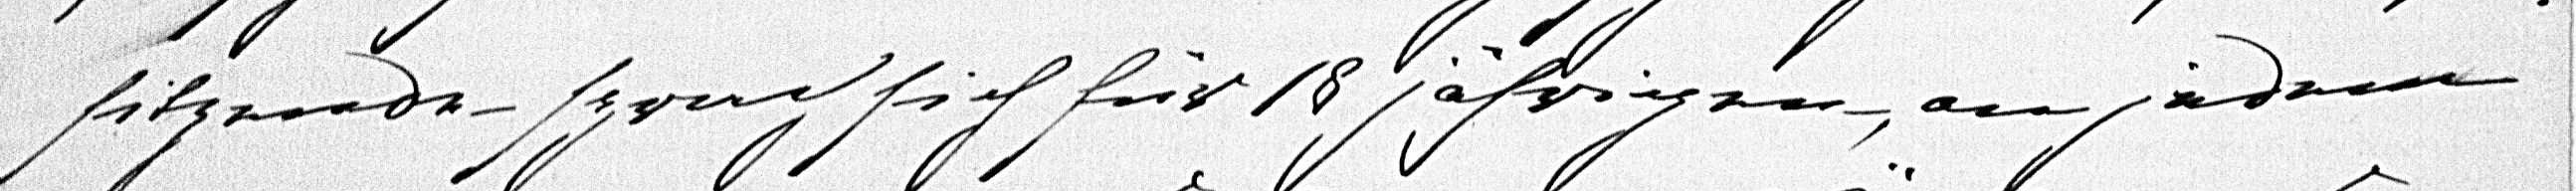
sitzende sprach sich für 18 jährigen, an jedme
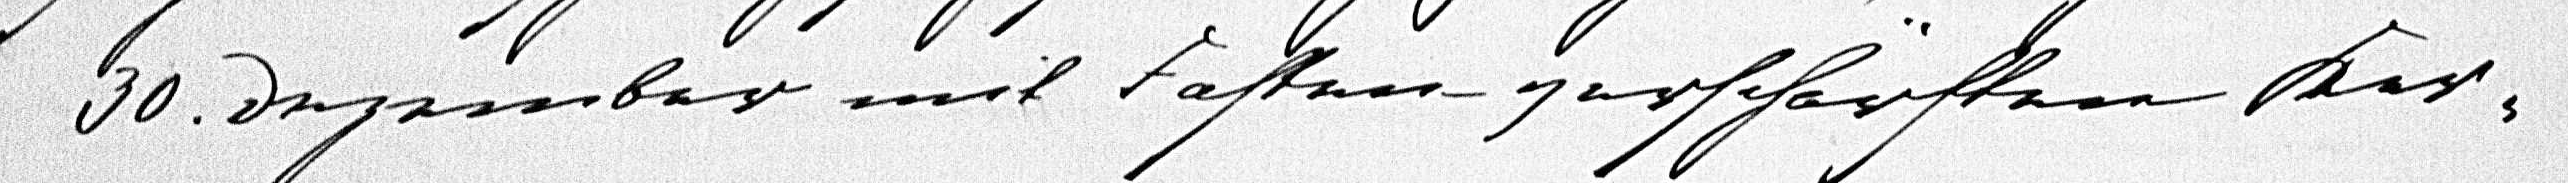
30. Dezember mit Fasten verschärften Ker¬
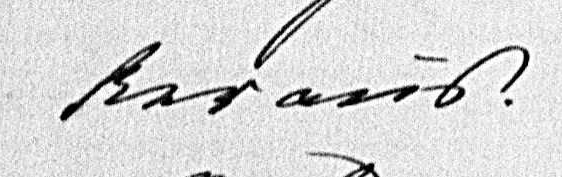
ker aus.
